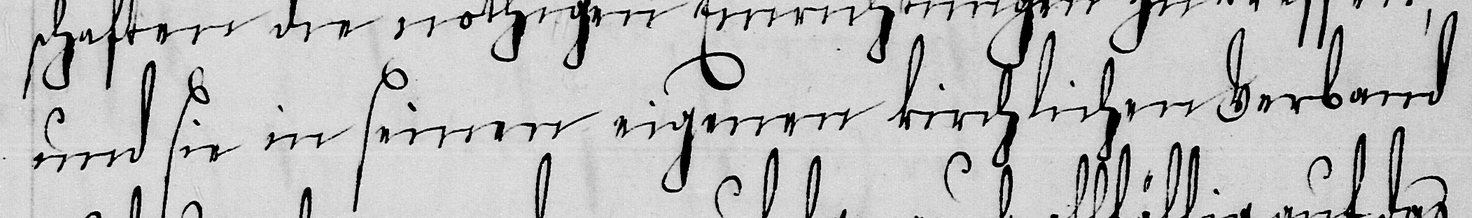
und sie in seinen eigenen kirchlichen Verband
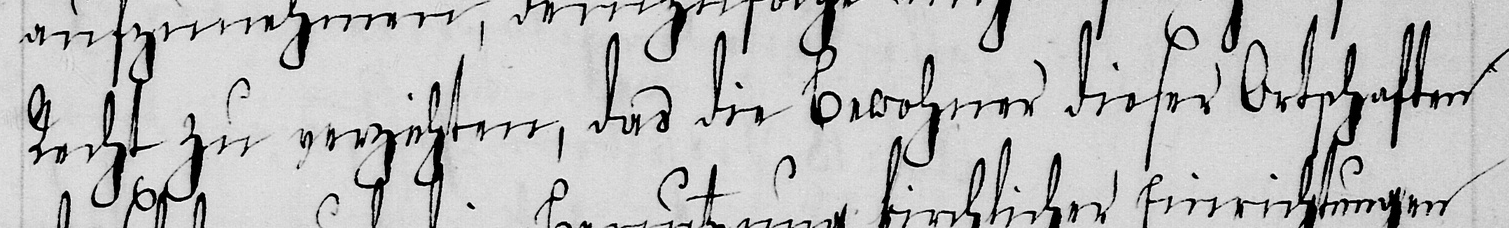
Recht zu verzichten, das die Bewohner dieser Ortschaften
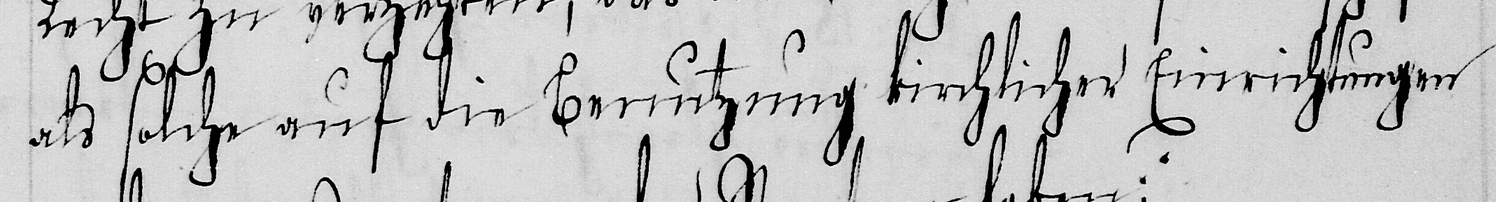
als solche auf die Benutzung kirchlicher Einrichtungen
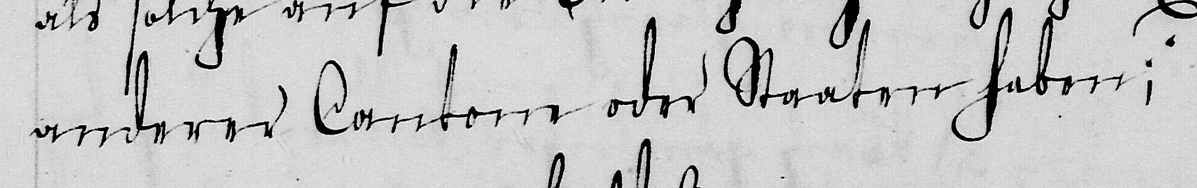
anderer Cantone oder Staaten haben;
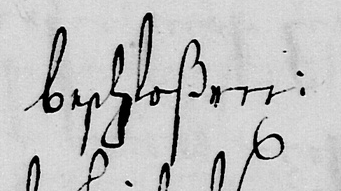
beschloßen:
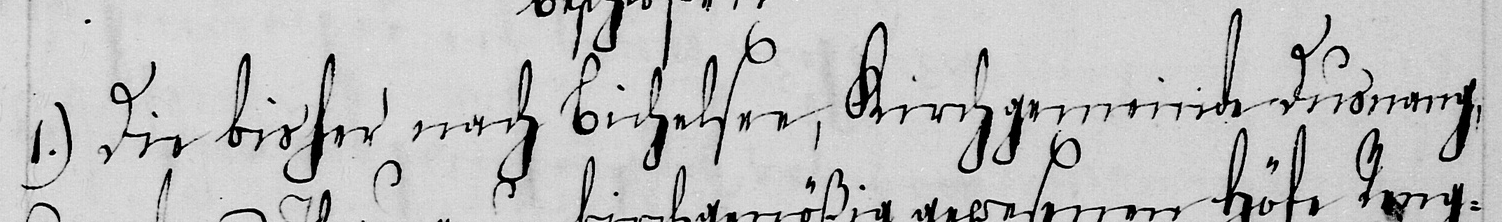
1.) Die bisher nach Bichelsee, Kirchgemeinde Dusnang,
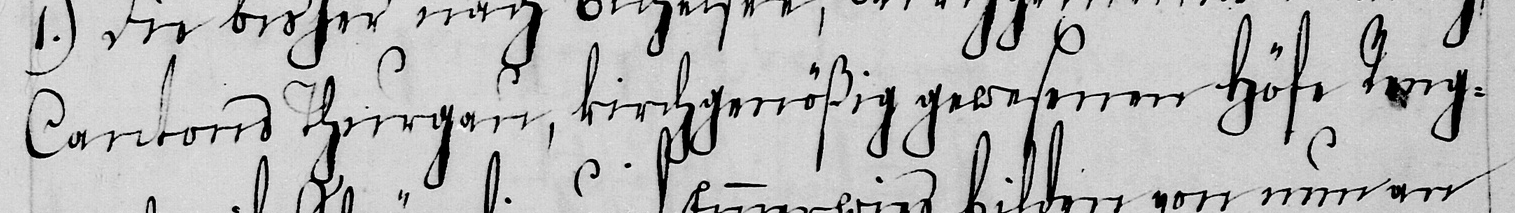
Cantons Thurgau, kirchgenößig gewesenen Höfe Reng¬
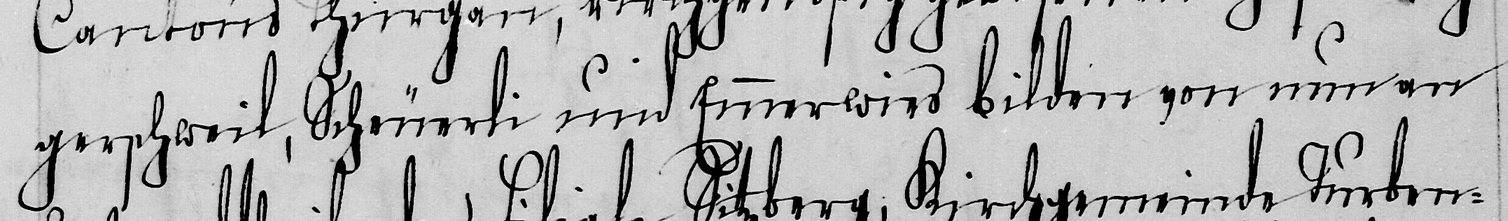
gerschweil, Scheuerli und Emmerwies bilden von nun an
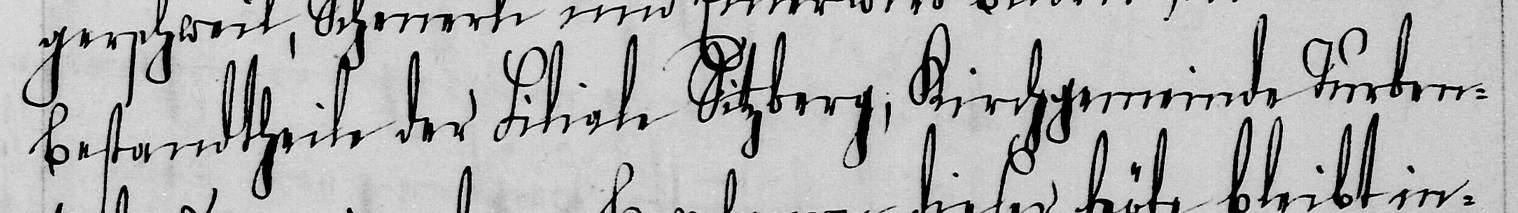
Bestandtheile der Filiale Sitzberg, Kirchgemeinde Turben¬
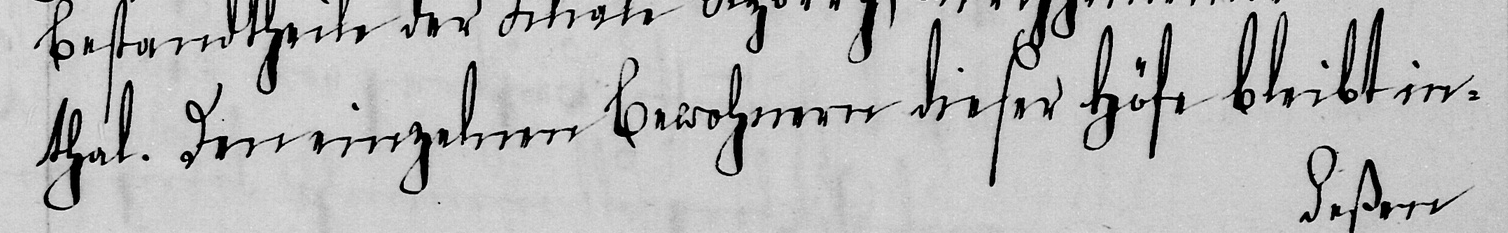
thal. Den einzelnen Bewohnern dieser Höfe bleibt in-
